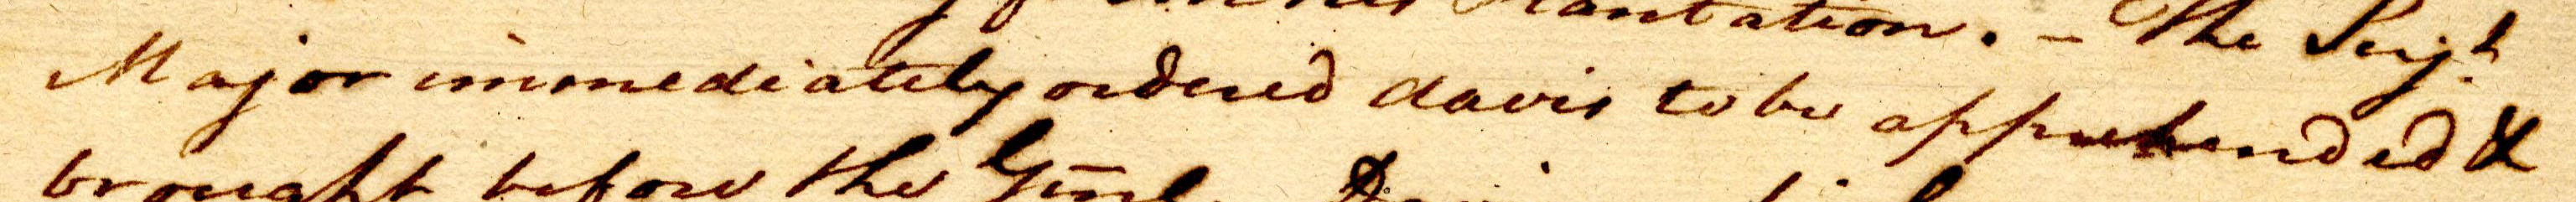Major immediately ordered Davis to be apprehended &
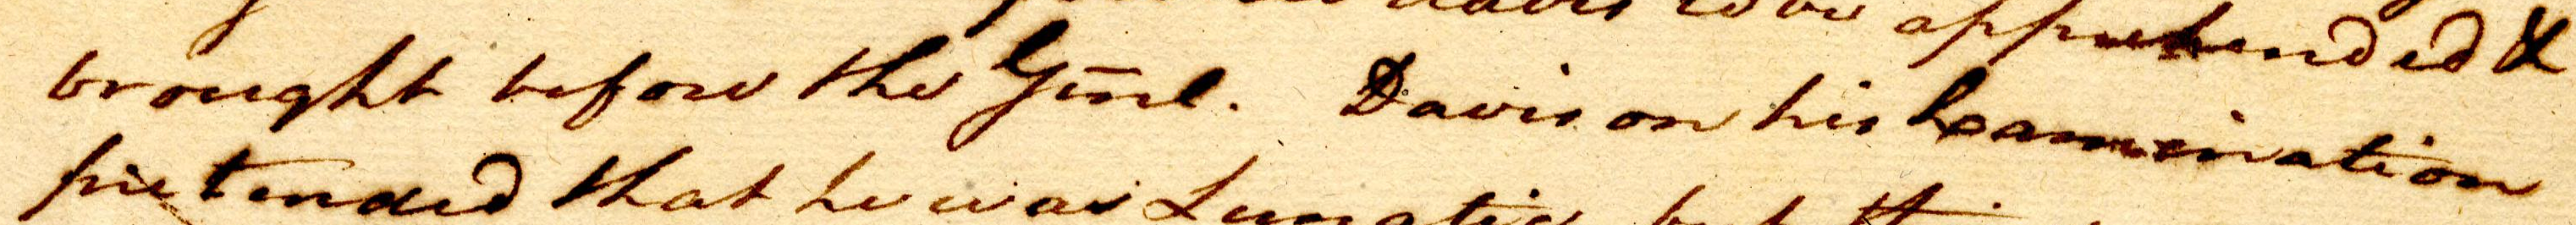brought before the Gen̄l. Davis on his examination
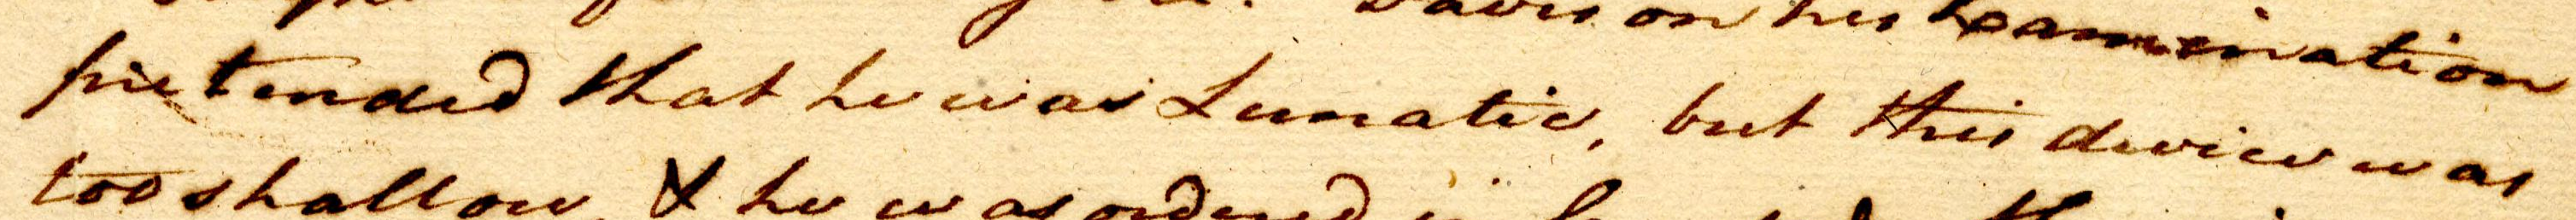pretended that he was Lunatic, but this device was
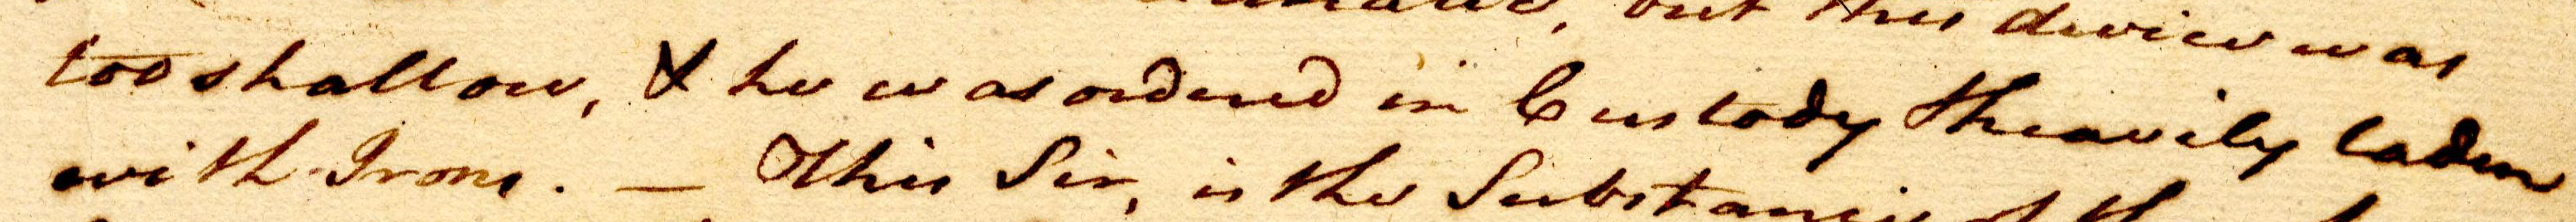too shallow, & he was ordered in Custody & heavily laden
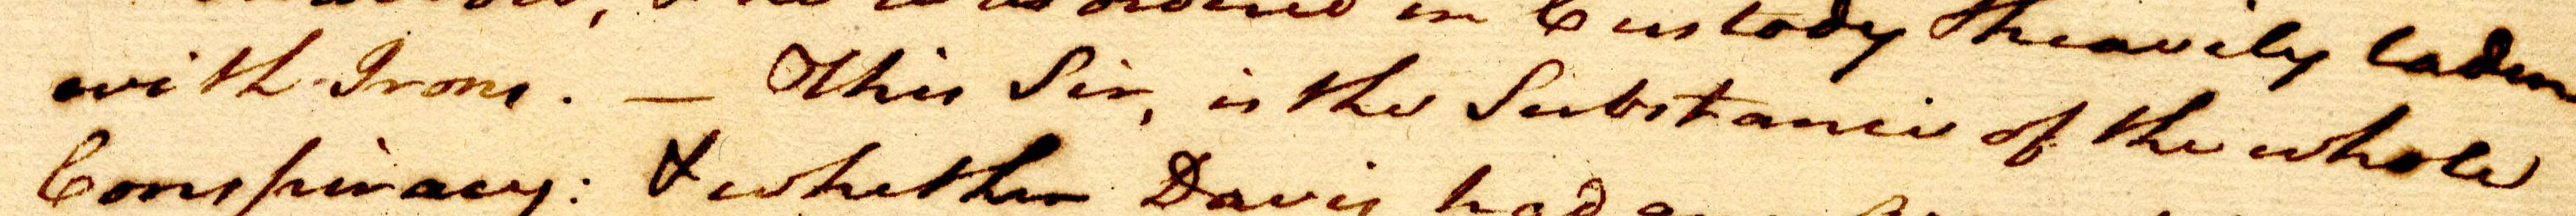with Irons.- This Sir, is the Substance of the whole
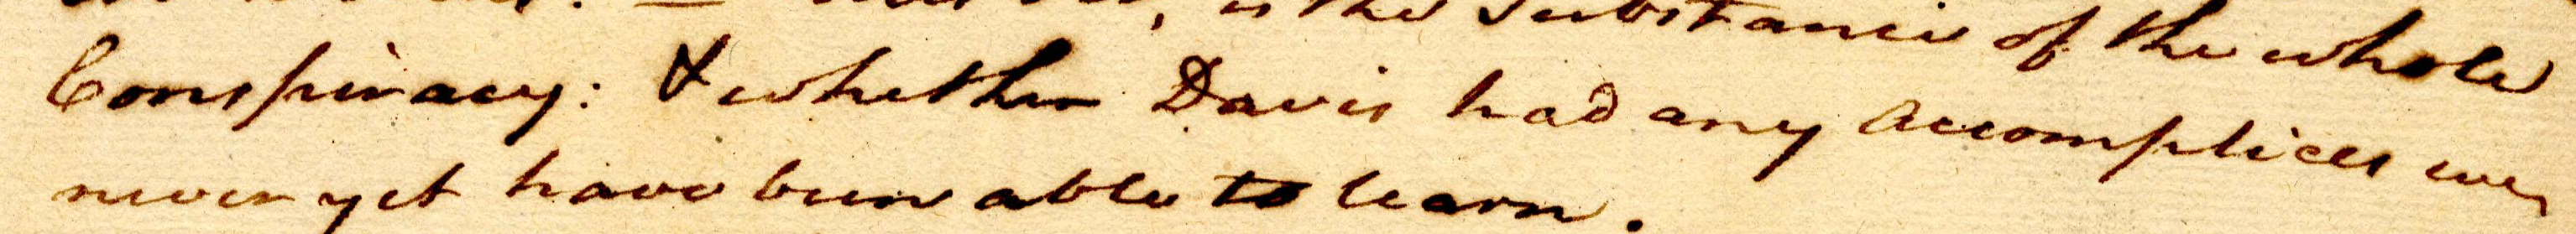Conspiracy: & whether Davis had any accomplices we
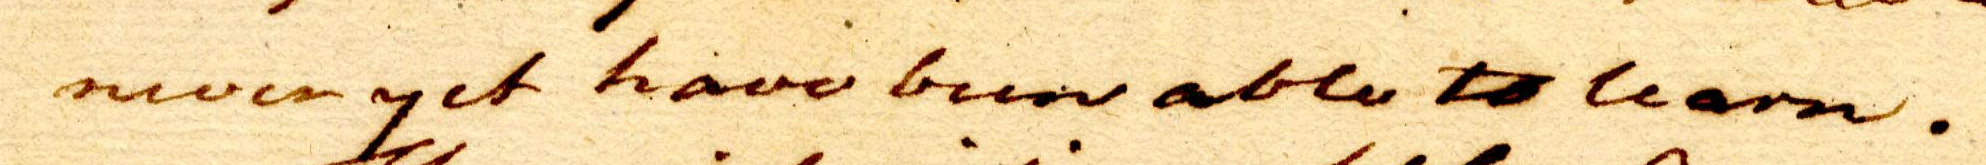never yet have been able to learn.
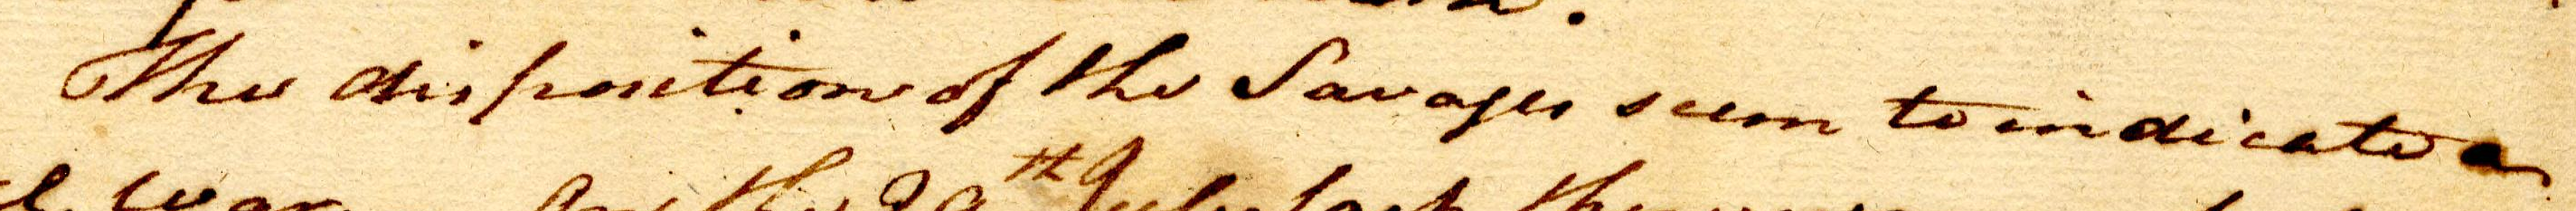The disposition of the Savages seem to indicate a
